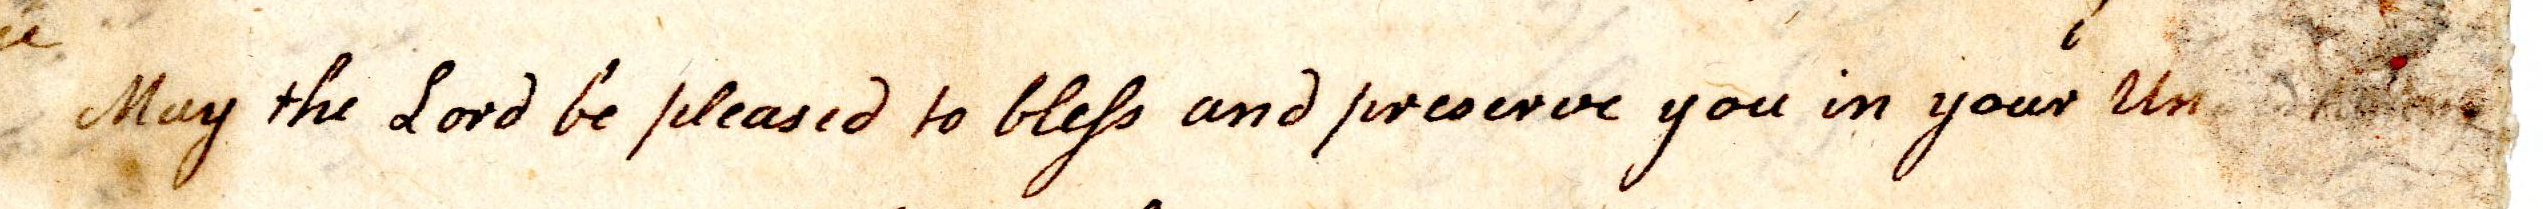May the Lord be pleased to bless and preserve you in your Un[______]
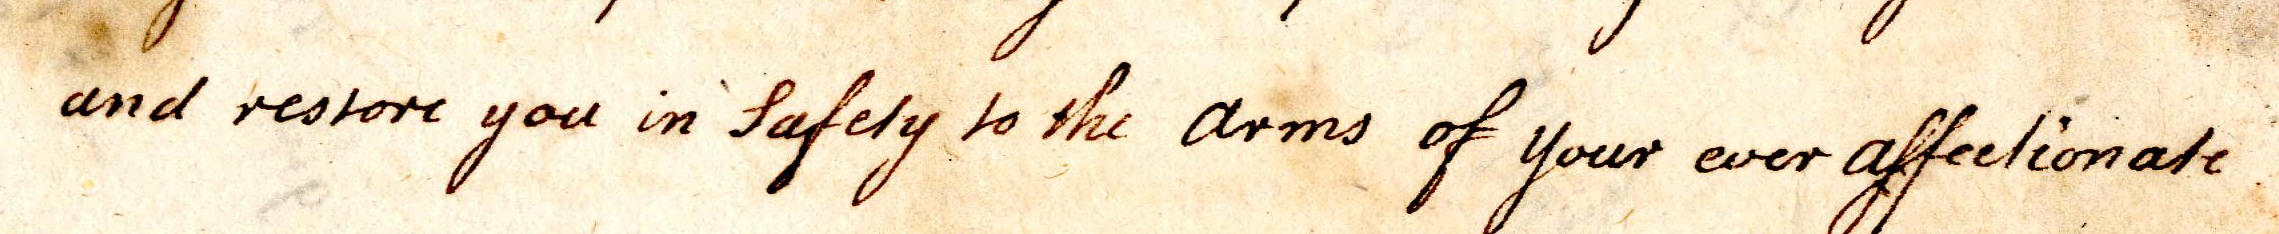and restore you in Safety to the arms of your ever affectionate
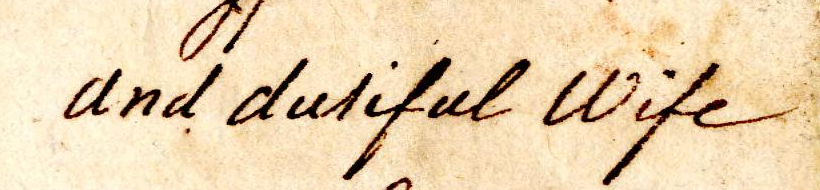and dutiful Wife
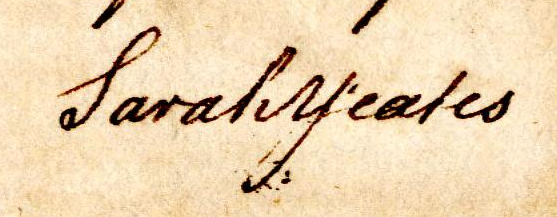Sarah Yeates
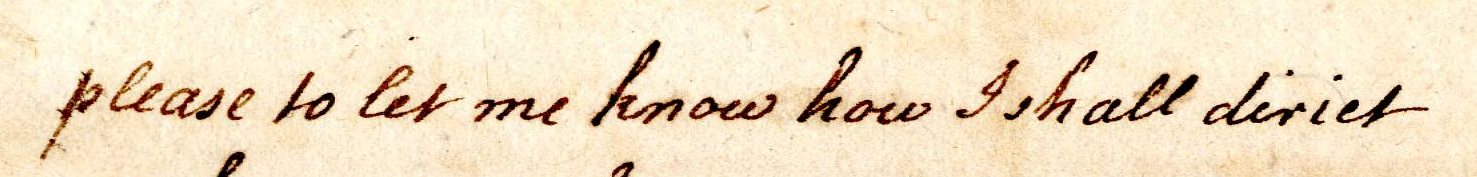please to let me know how I shall dirict
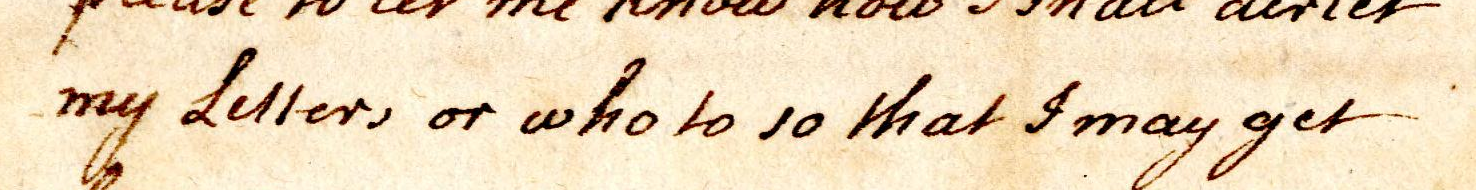my Letters or who to so that I may get
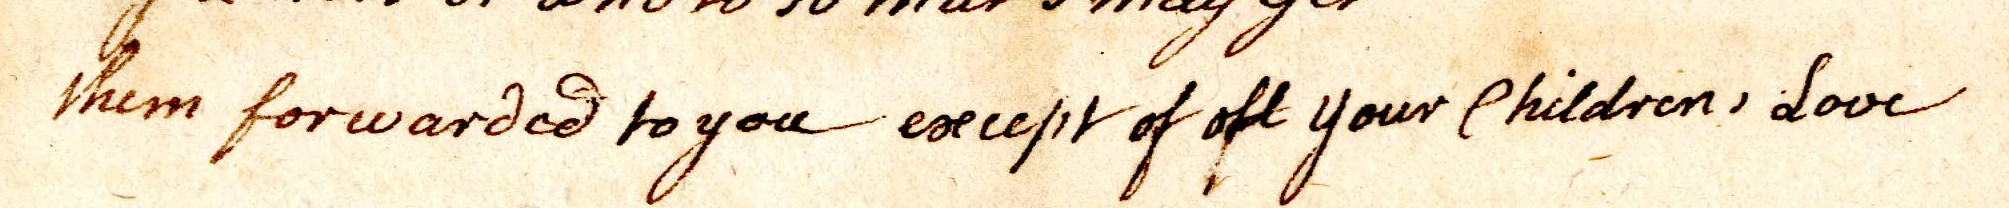them forwarded to you except of oft your Children, Love
